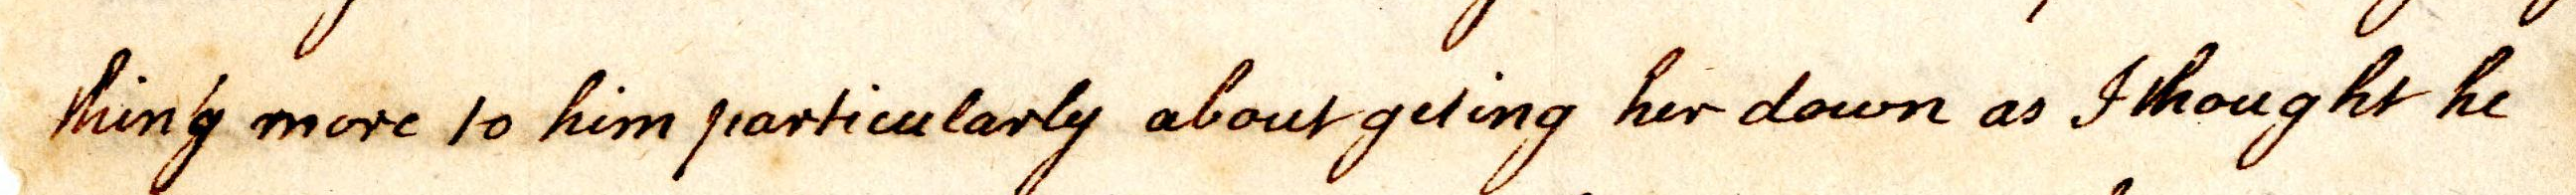thing more to him particularly about geting her down as I thought he
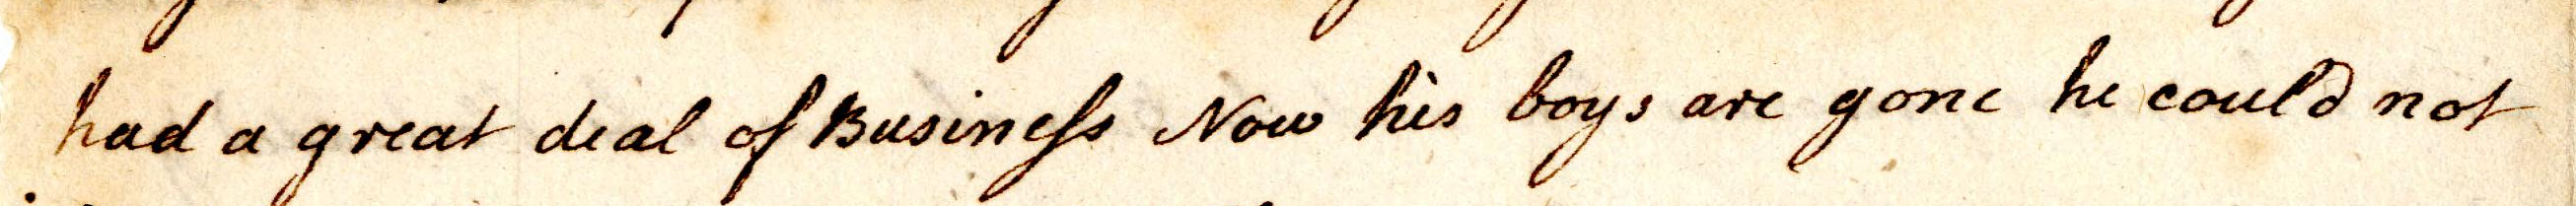had a great deal of Business Now his boys are gone he could not
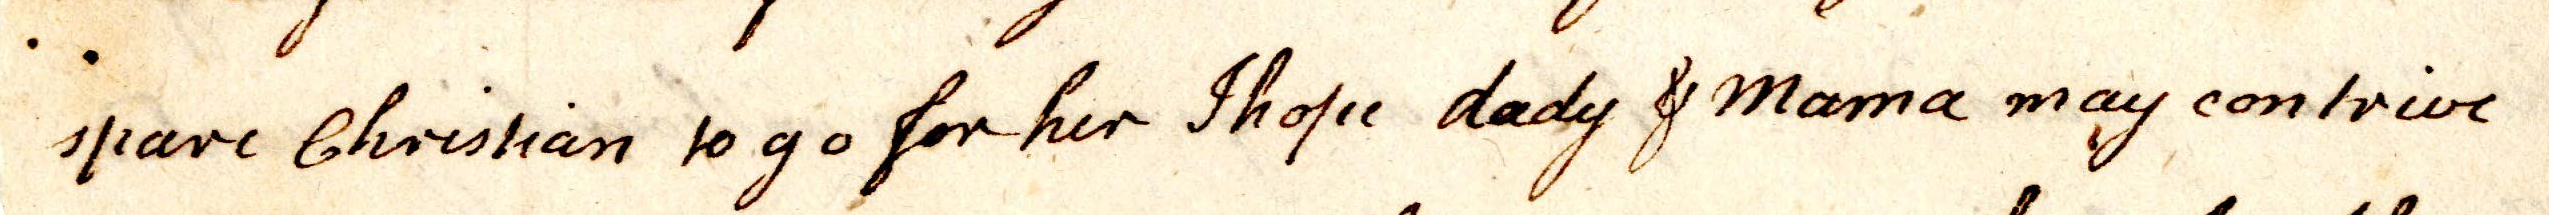spare Christian to go for her I hope dady & Mama may contrive
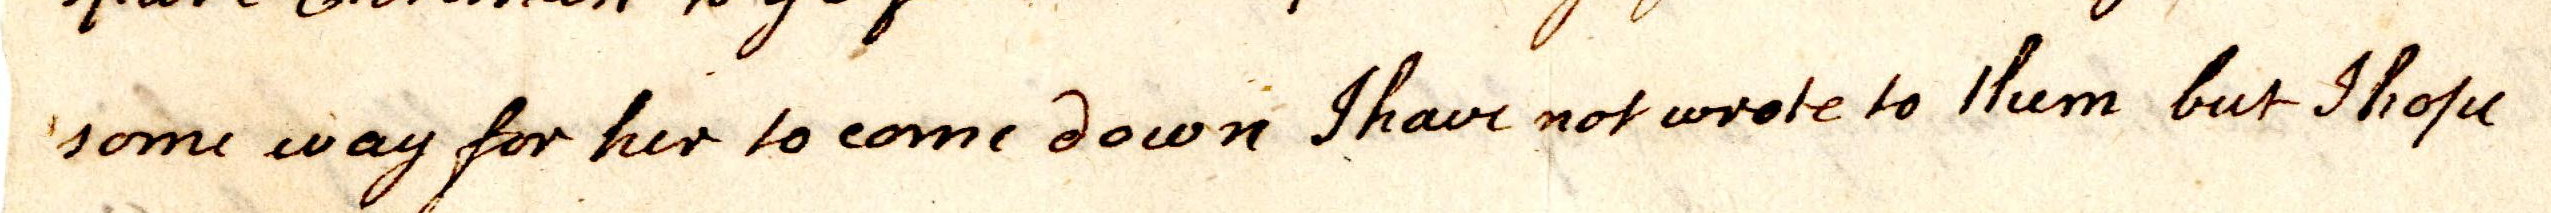some way for her to come down I have not wrote to them but I hope
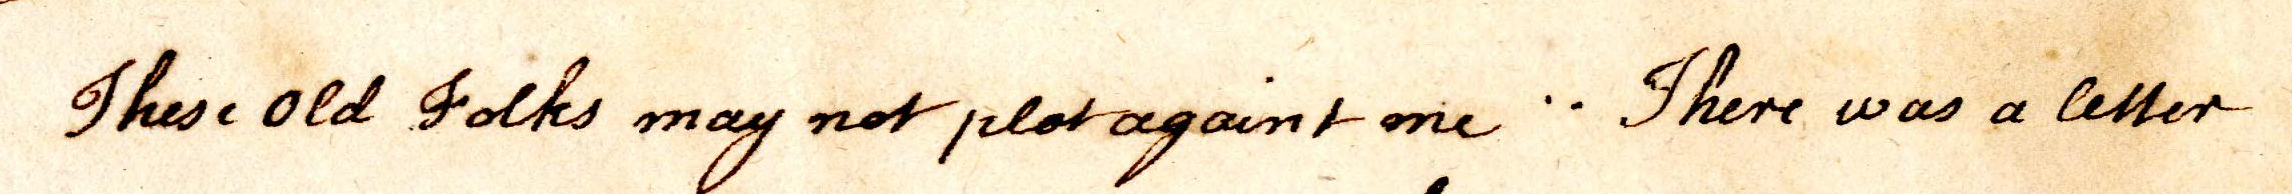These old Folks may not plot against me There was a letter
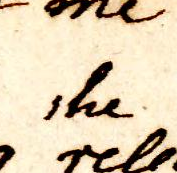the
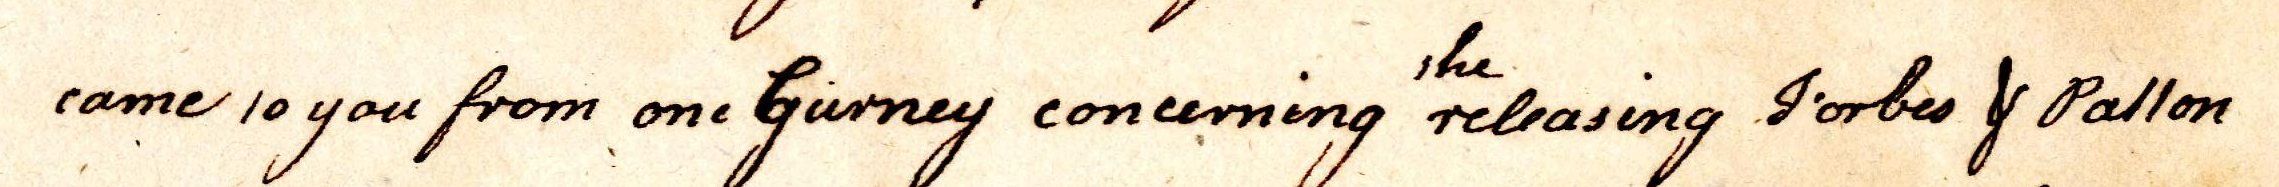came so you from one Gurney concerning releasing Forbes & Patton
